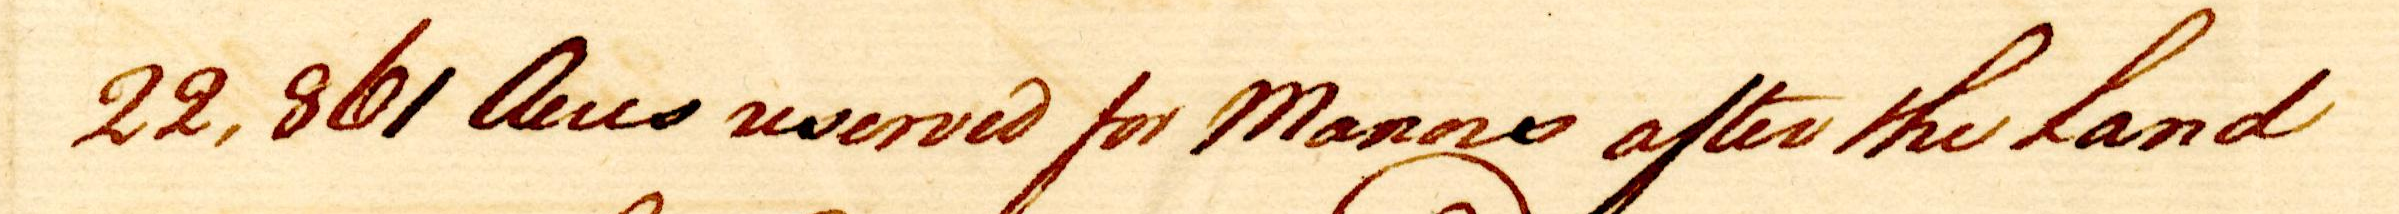22,861 Acres reserved for Manor after the Land
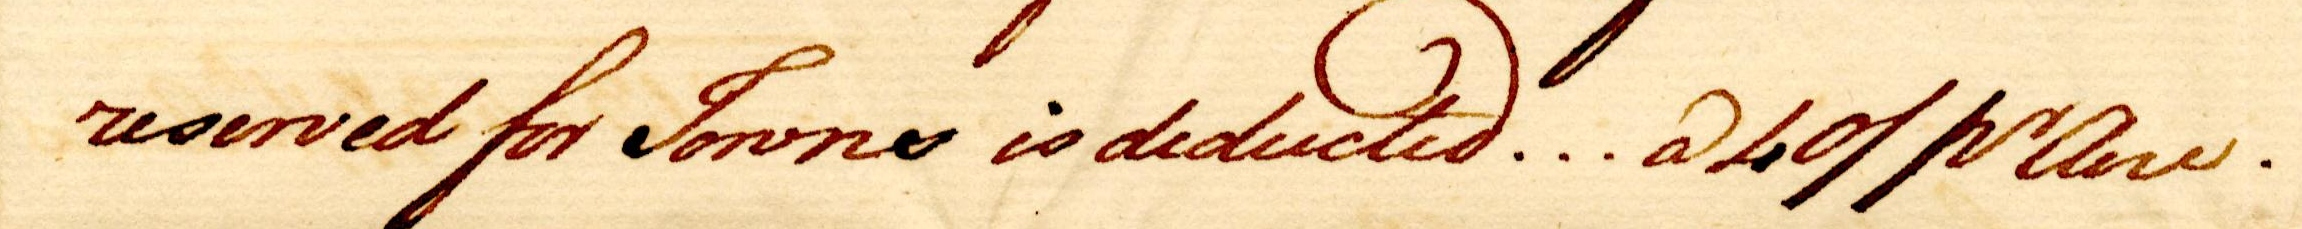reserved for Towns is deducted... @ 40s p^r Acre
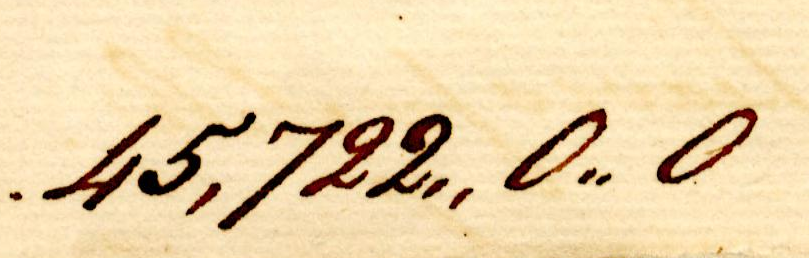45,722.0.0
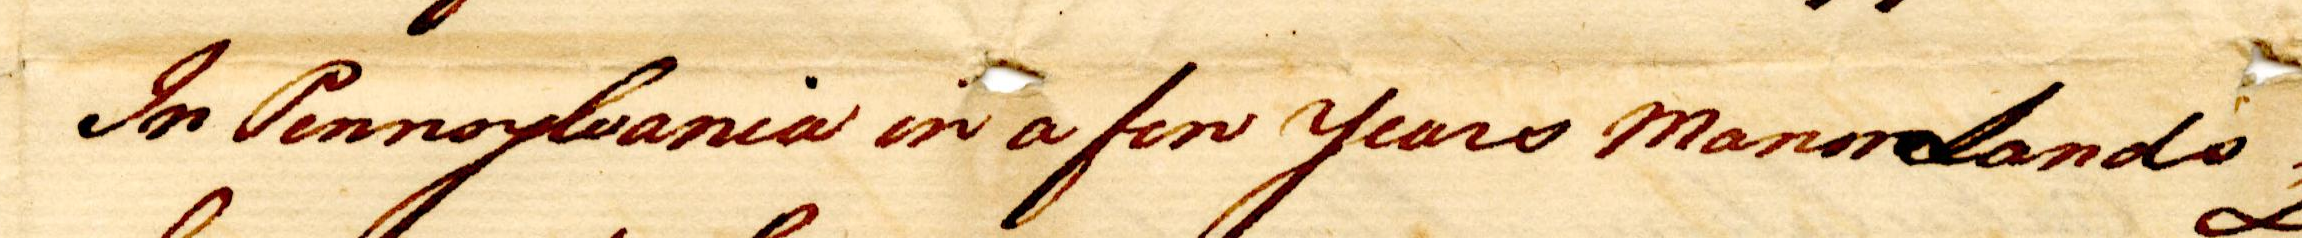In Pennsylvania in a fer years manor Lands
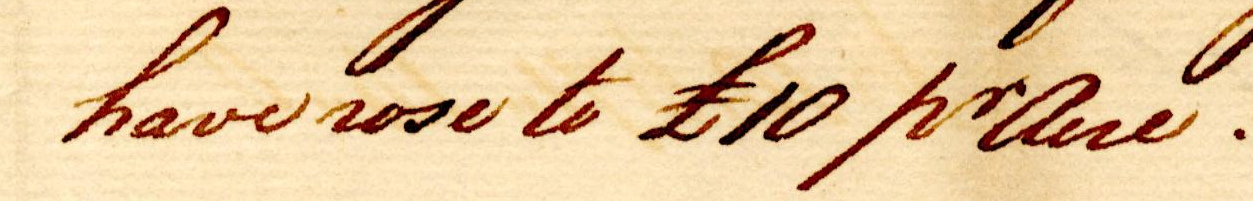have rose to £10 p^r Acre
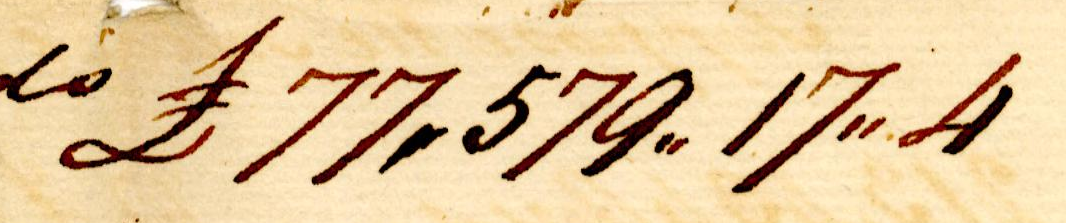£77,579.17.4
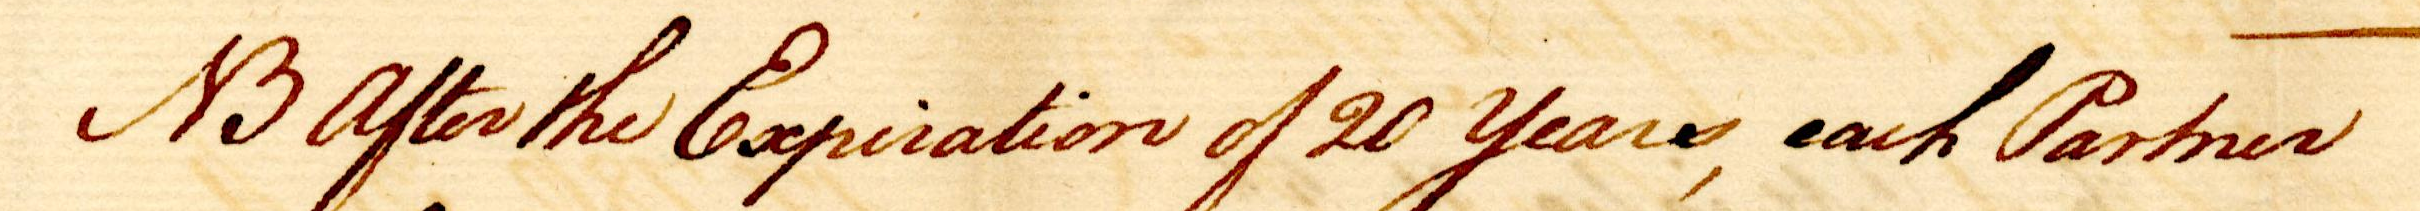NB After the Expiration of 20 years, each Partner
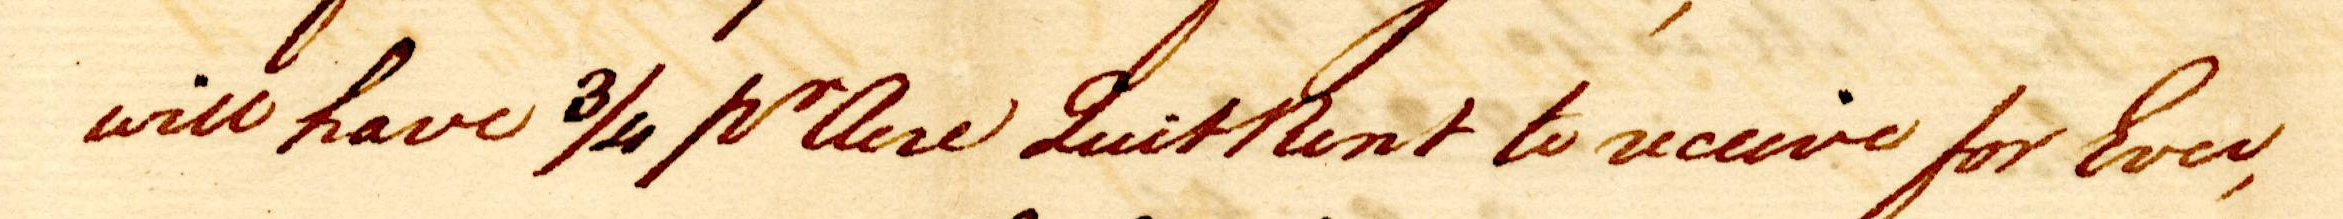will have 3/4 p^r acre Quit Rent to receive for Ever,
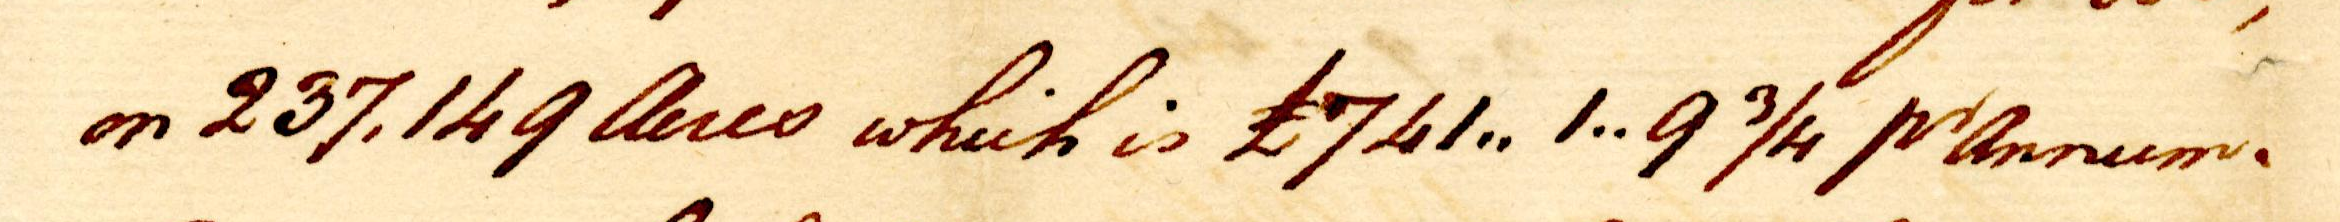on 237,149 Acres which is £741.1.9 3/4 p^r Annum.
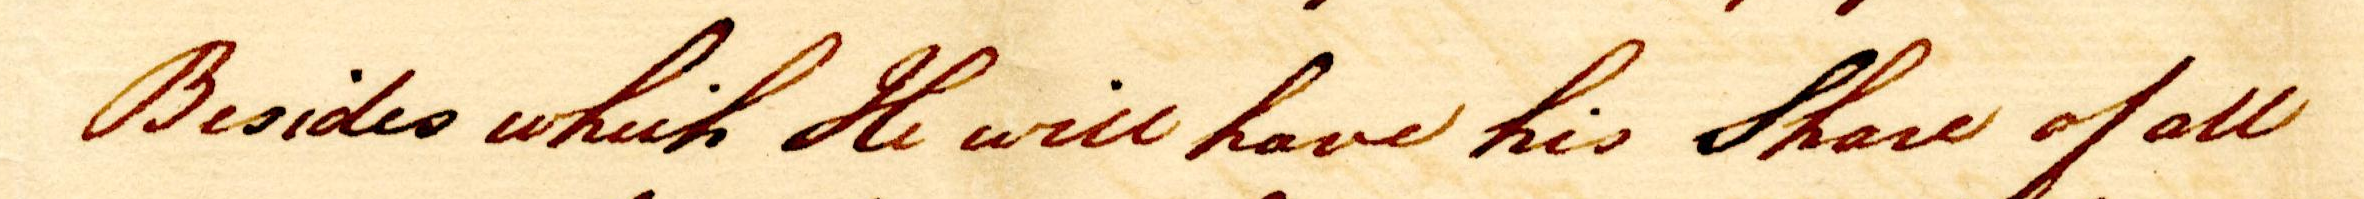Besides which He will have his Share of all
